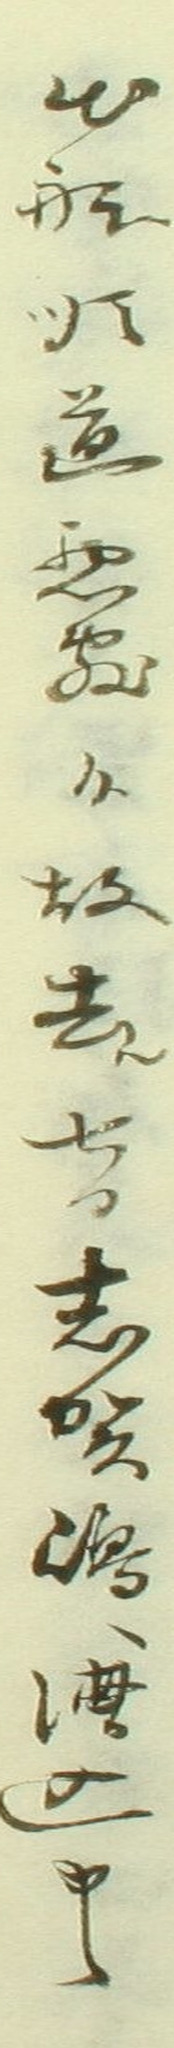出船順道悪敷候故去る七日志賀島へ漕込申候
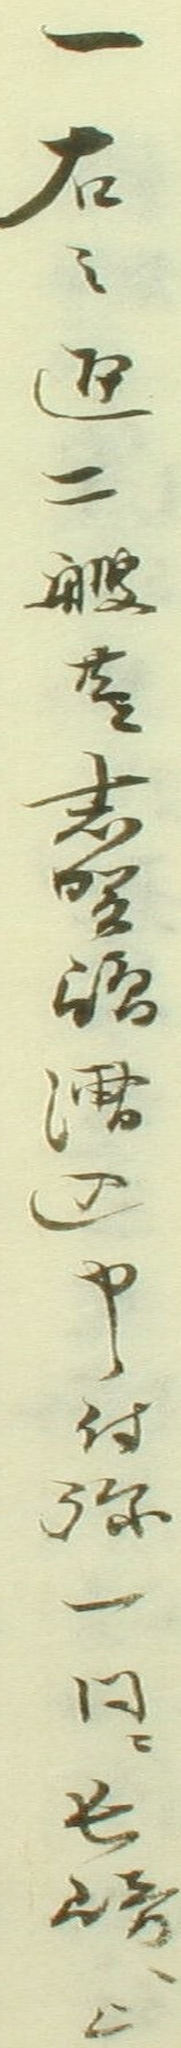一右之通二艘共に志賀島漕込申候付弥一同に長崎へ
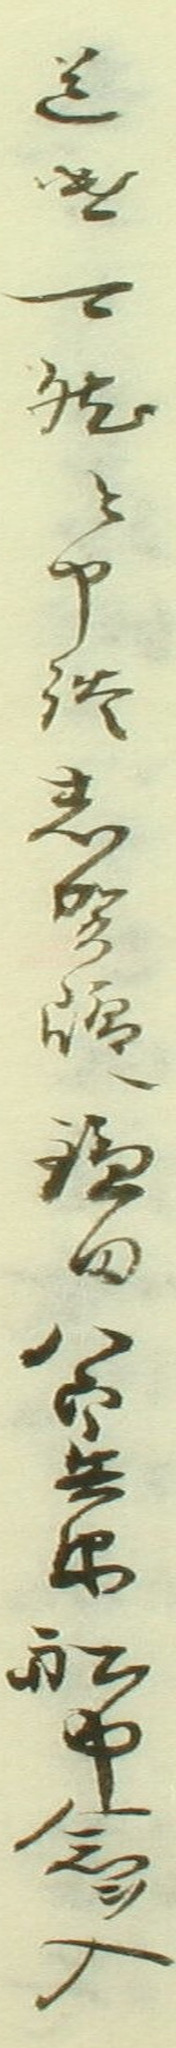送遣可然と申談志賀島へ鎌田八郎兵衛船中念を入
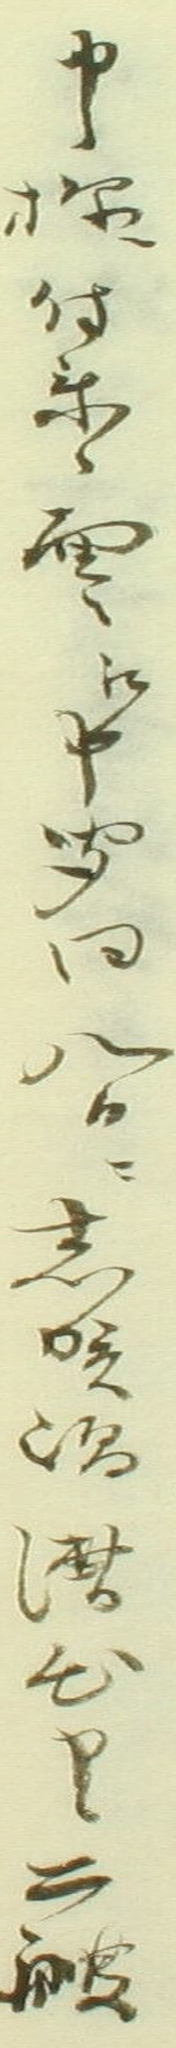申候様付参候面々え申聞同八日に志賀島漕出申候二艘
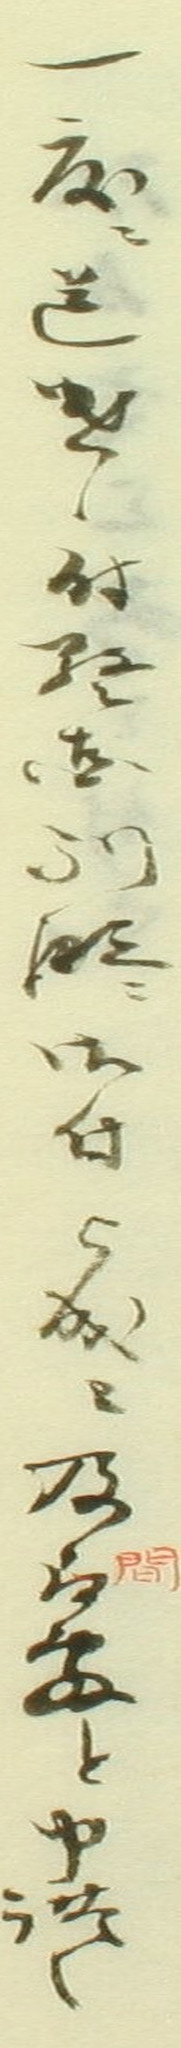一度に送遣候付警固別段に御付被成に及間敷と申談候
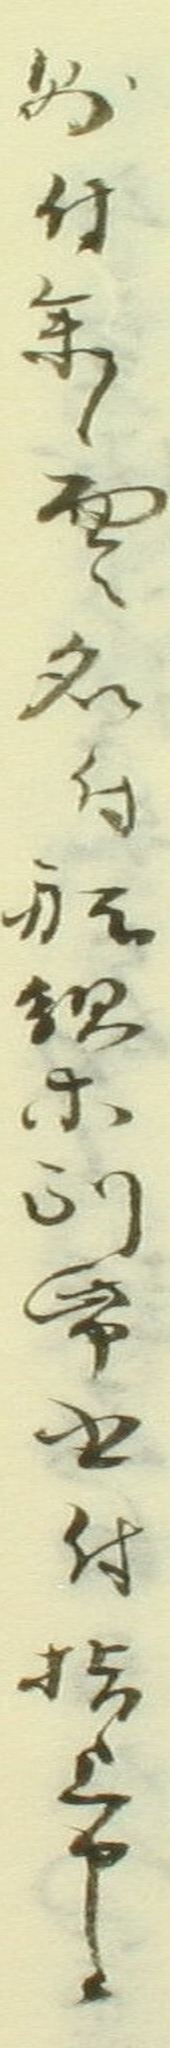則付参候面々名付船組等別紙書付指上申候
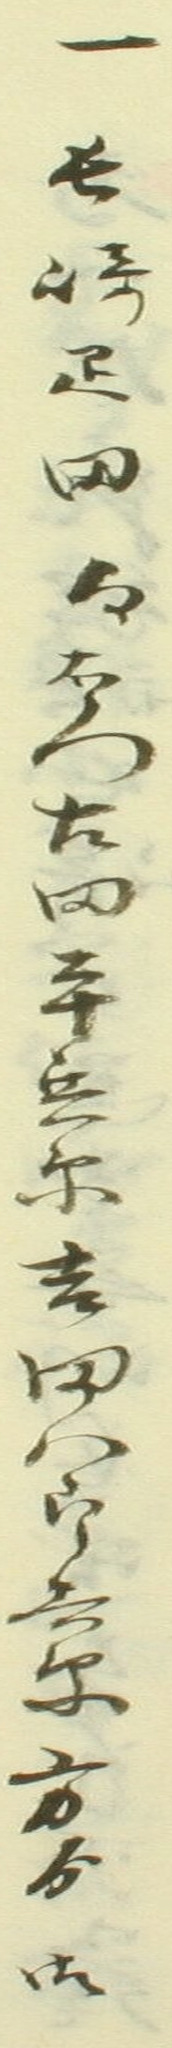一長崎疋田与右衛門古田平兵衛吉田八郎兵衛方より御
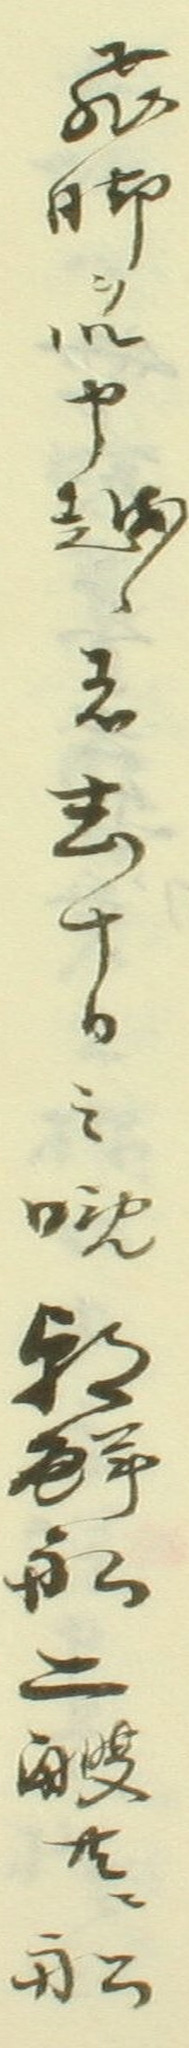飛脚を以申越は去十日之晩朝鮮船二艘共に船
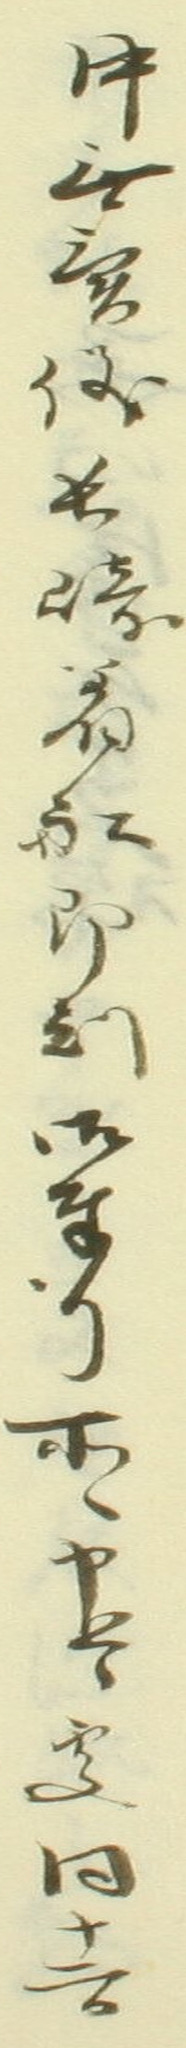中無実儀長崎着船即刻御奉行所へ申上候処同十二日
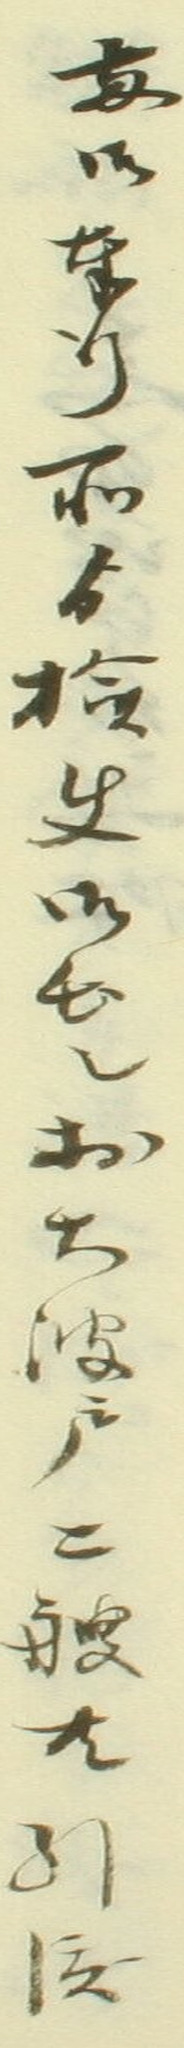両御奉行所より検使御出し於大波戸二艘共引渡
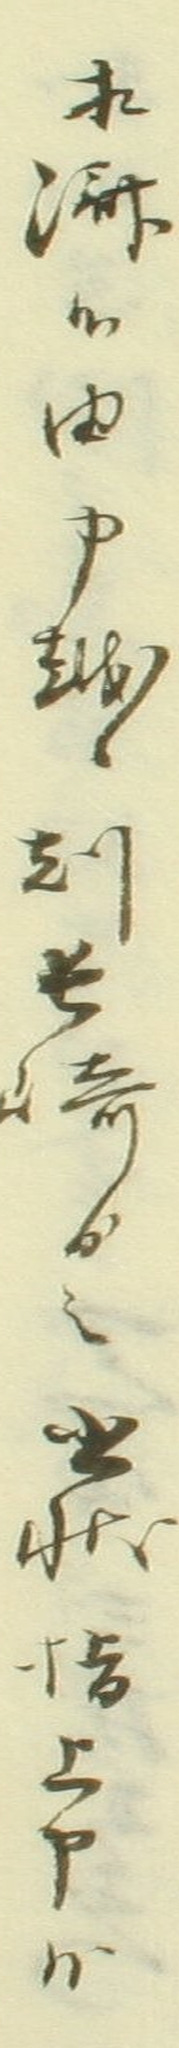相済候由申越候則長崎より之書状指上申候
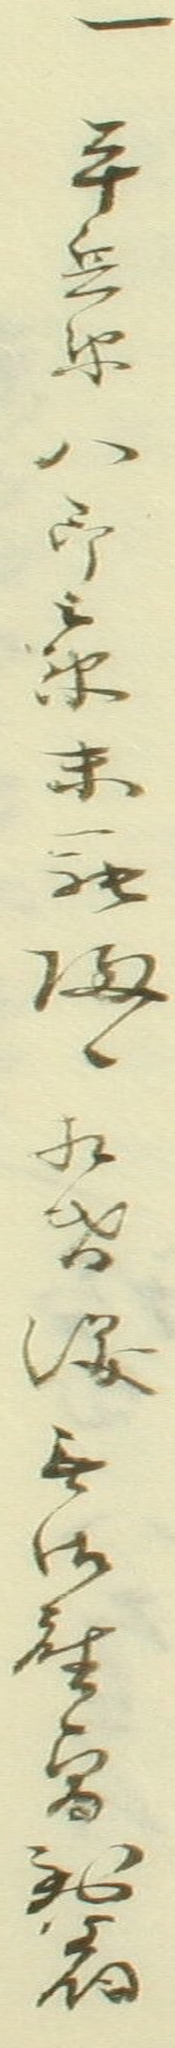一平兵衛八郎兵衛未罷帰候相替儀無御座候間致着
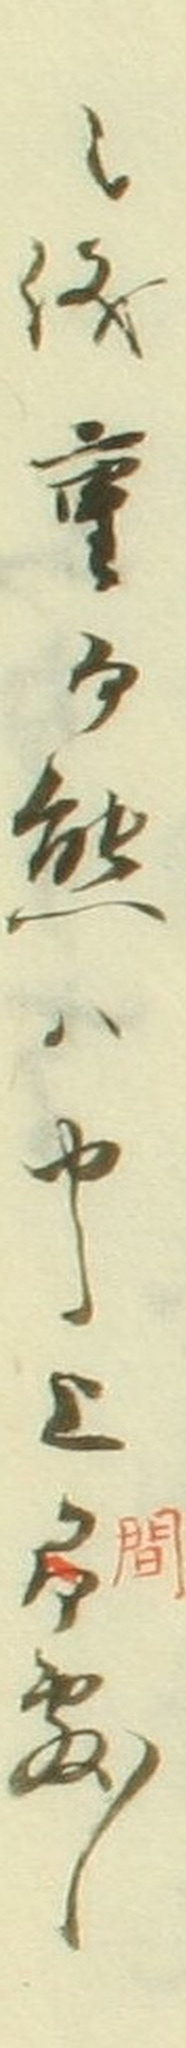之儀重て態は申上間敷候
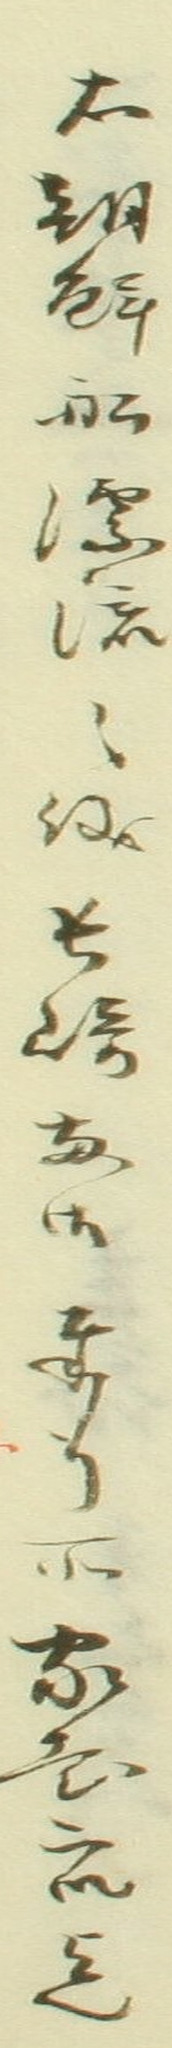一右朝鮮船漂流之儀長崎両御奉行所家老衆迄
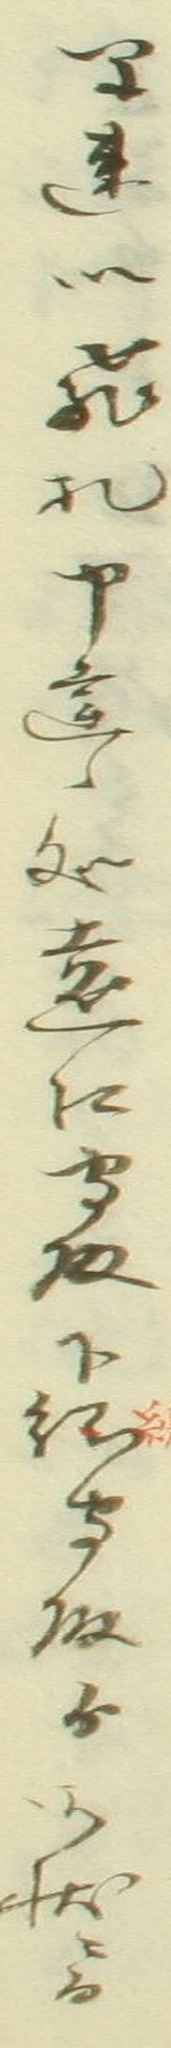早速以飛札申遣候処遠江守殿下総守殿より御状にて
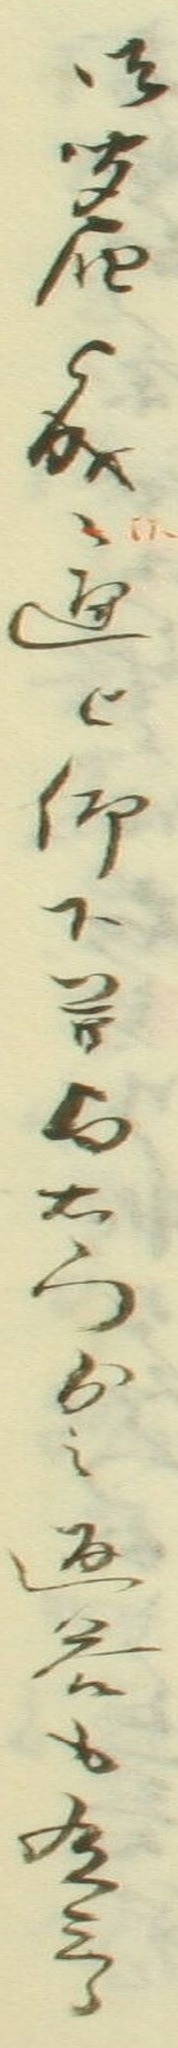御聞届被成候通被仰下并与右衛門より返答も有之候
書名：朝鮮船御領内漂流記 坤
